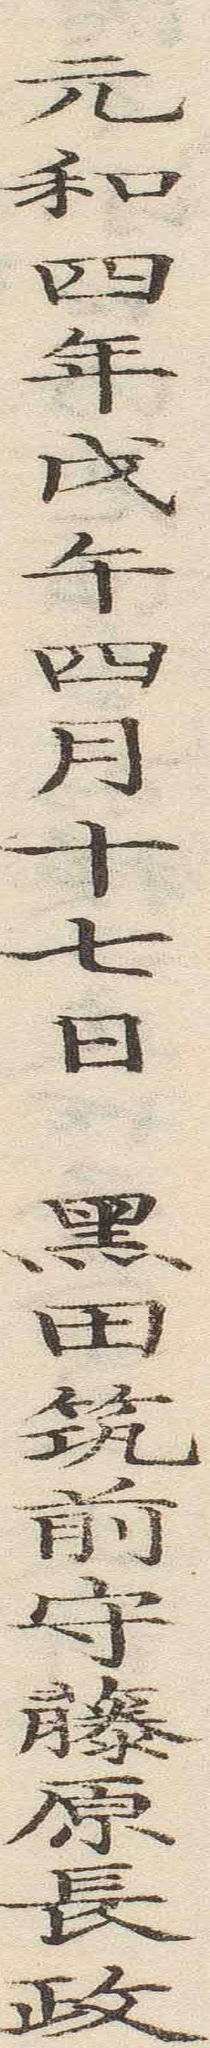元和四年戊午四月十七日黑田筑前守藤原長政
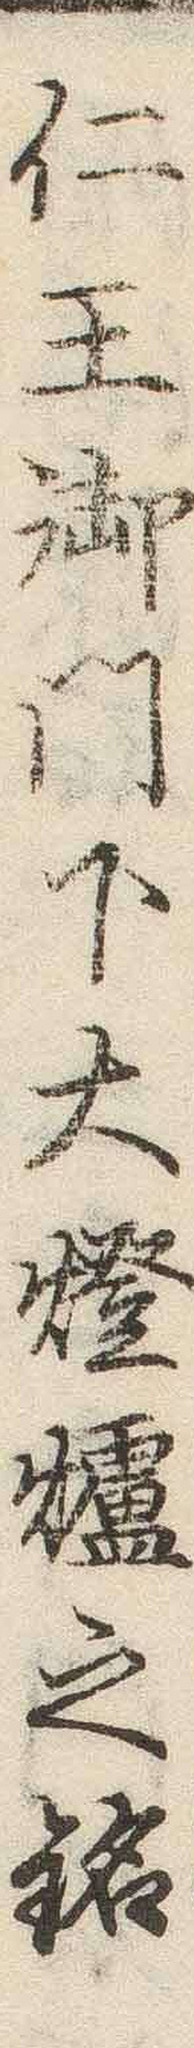仁王御門下大燈爐之銘
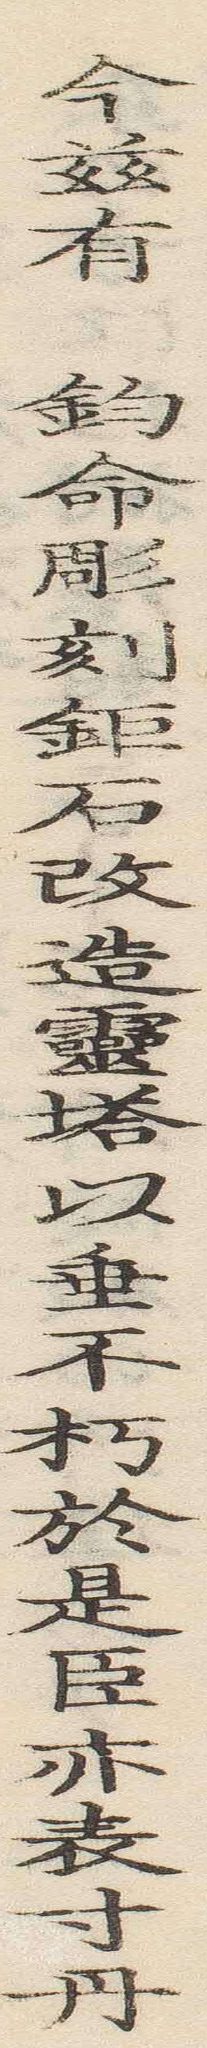今兹有鈞命彫刻鉅石改造靈塔以垂不朽於是臣亦表寸丹
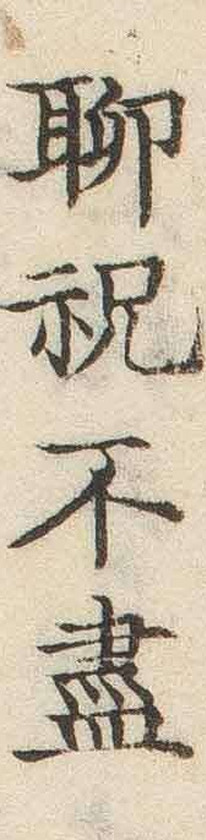聊祝不盡
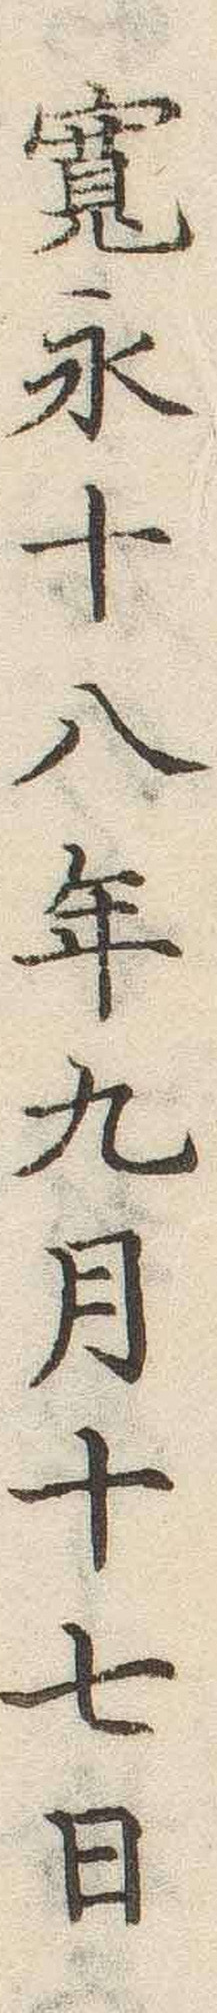寬永十八年九月十七日
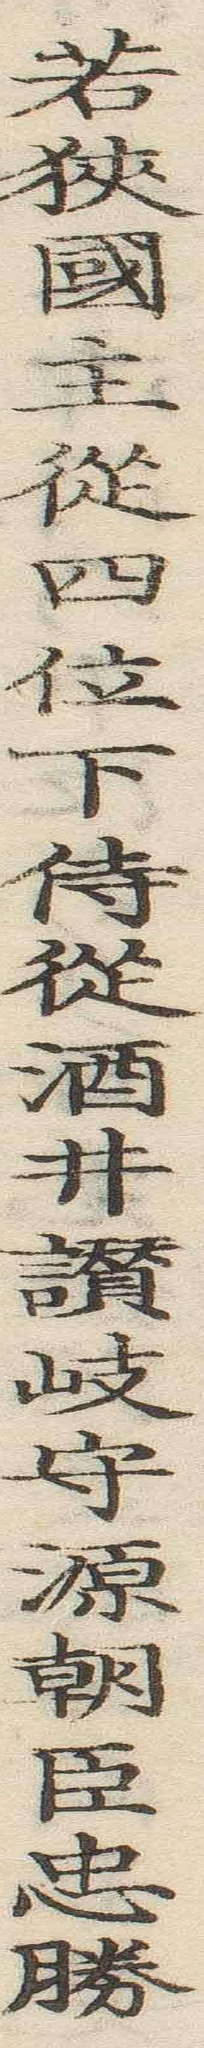若狹國主從四位下侍從酒井讃岐守源朝臣忠勝
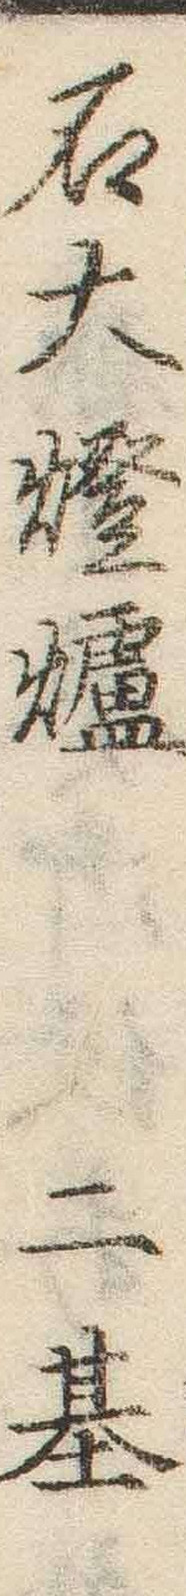石大燈爐二基
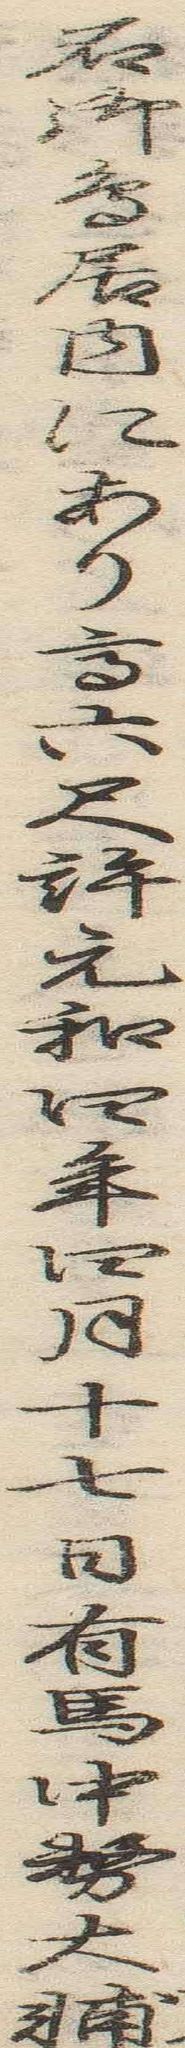石御鳥居内にあり高六尺許元和四年四月十七日有馬中務大輔
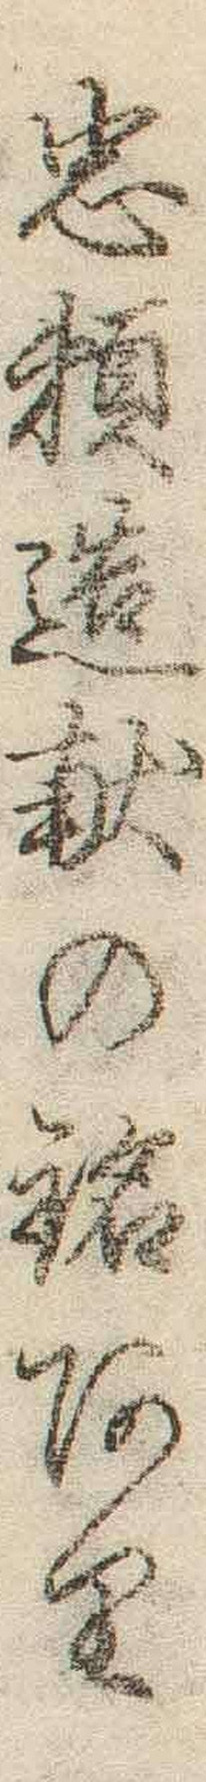忠頼造献の銘あり
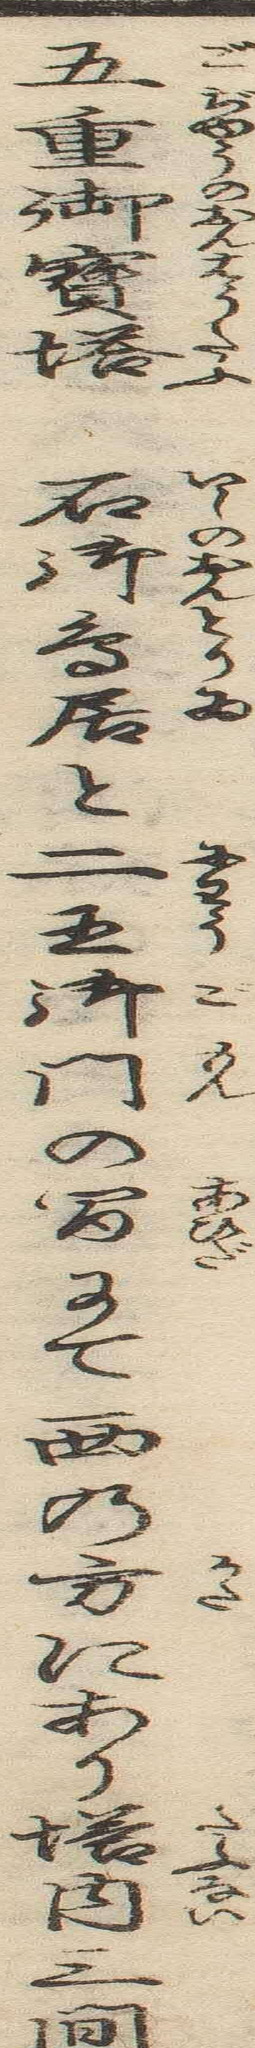五重御寶塔石御鳥居と二王御門の間にて西の方にあり塔内三間

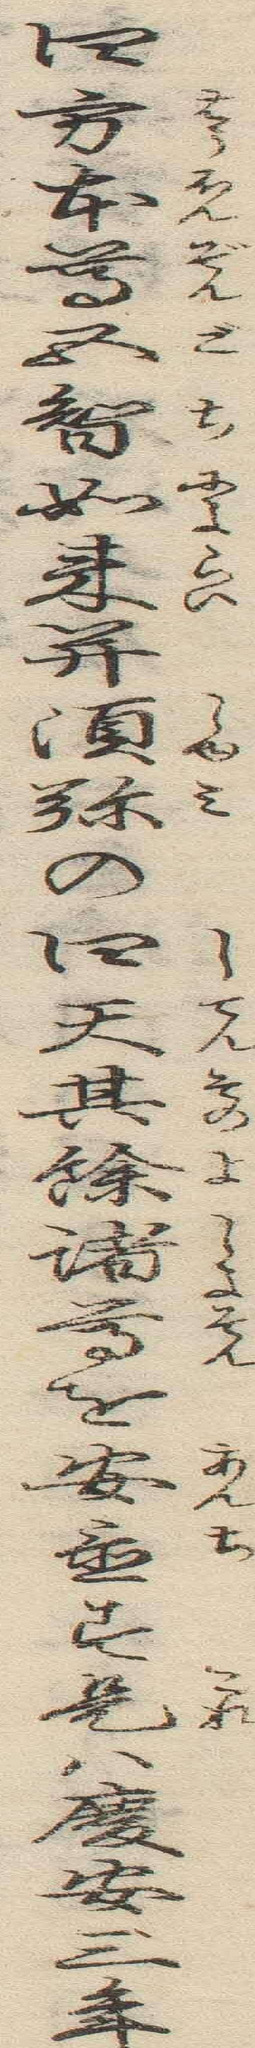四方本尊五智如来并須弥の四天其餘諸尊を安置す是は慶安三年
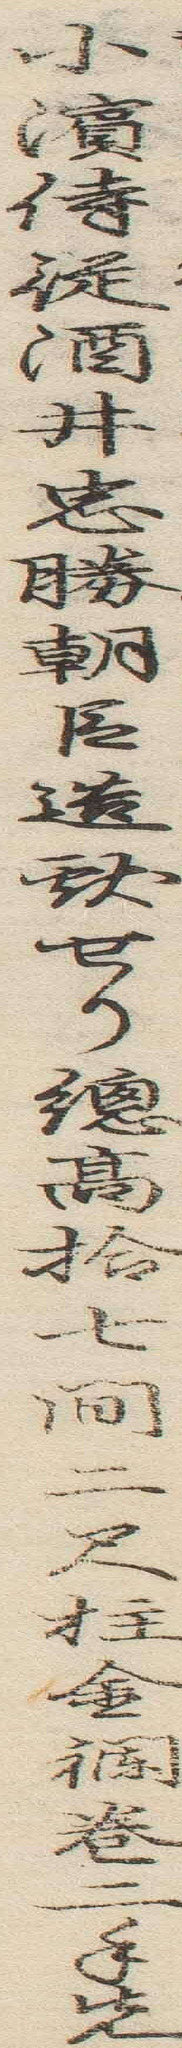小濵侍従酒井忠勝朝臣造献せり總髙拾七間二尺柱金襴巻二手先
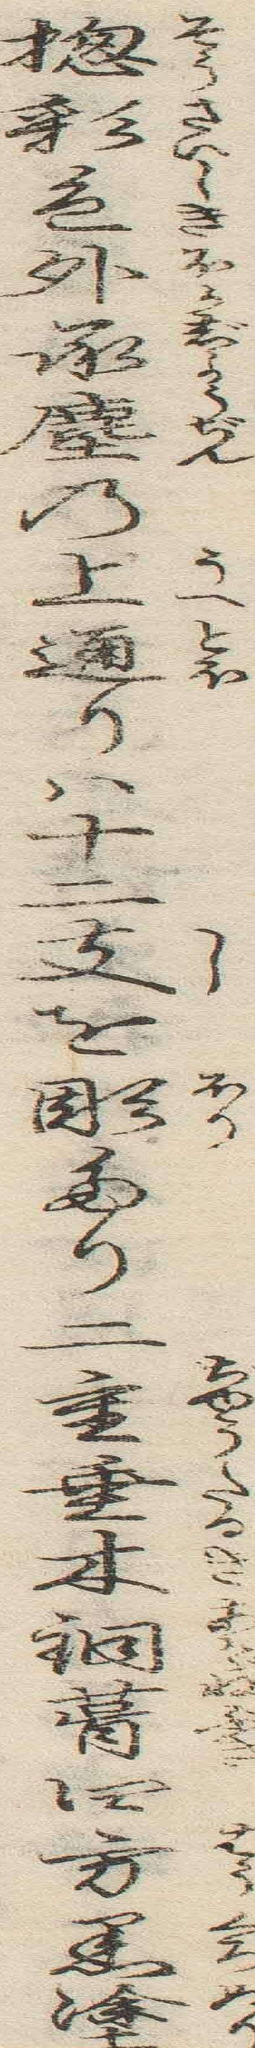揔彩色外承塵の上通りは十二支を彫たり二重垂木銅葺四方黒塗
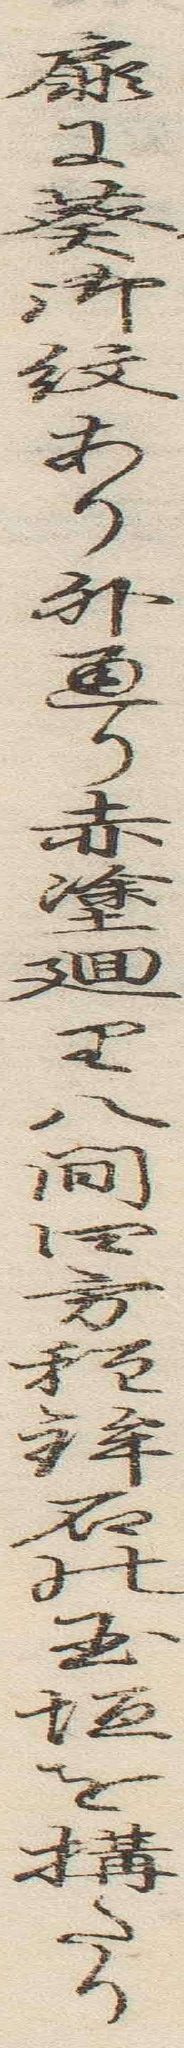扉に葵御紋あり外通り赤塗廽り八間四方程鉾石の玉垣を構たり
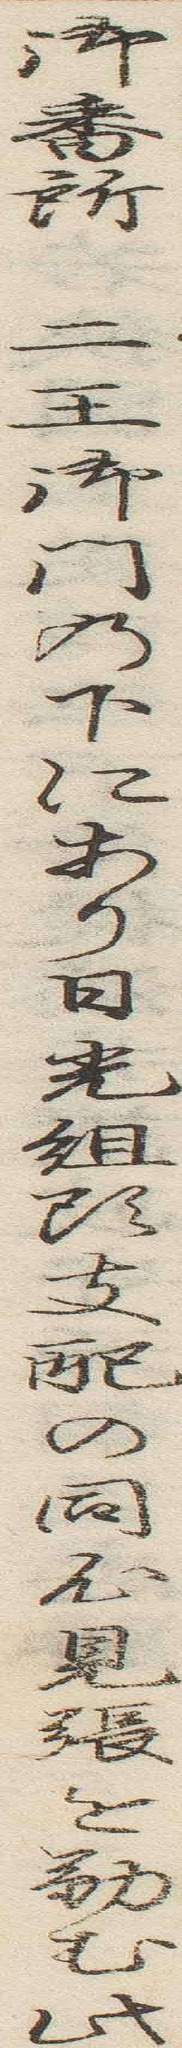御番所二王御門の下にあり日光組頭支配の同心見張を勤む此
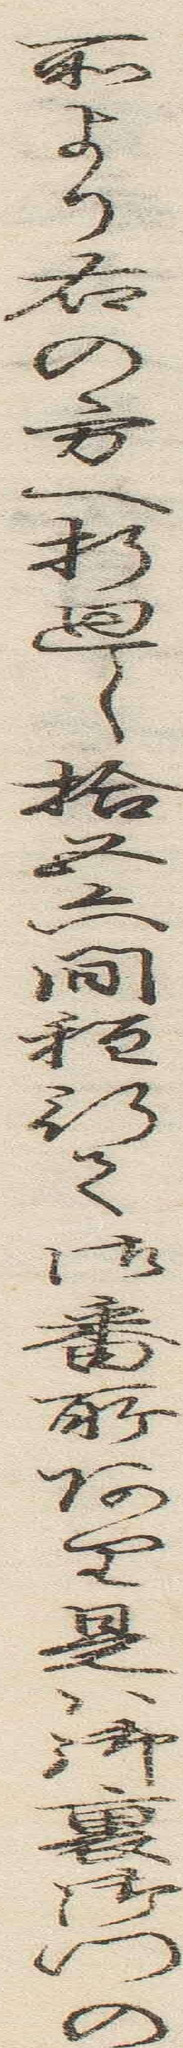所より右の方へ折廻し拾五六間程行て御番所あり是は御裏御門の
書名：日光山志
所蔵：東京学芸大学附属図書館 国文学研究資料館
